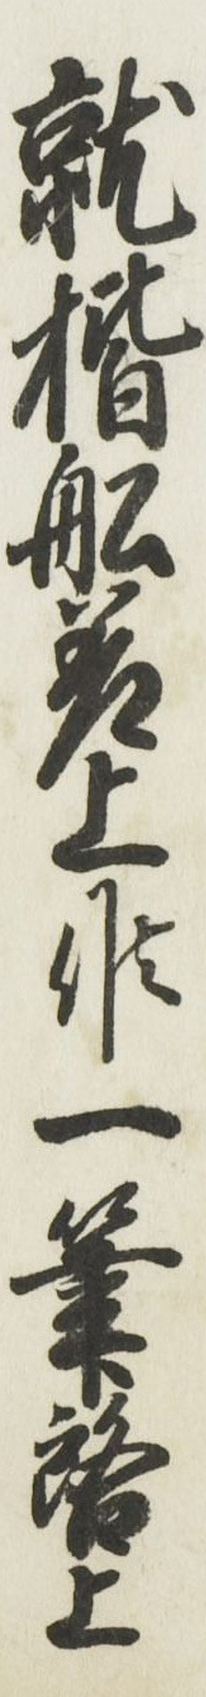就楷船差上候一筆啓上
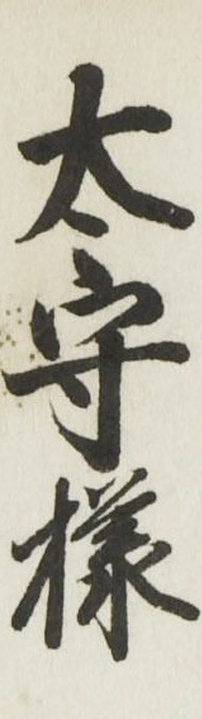太守様
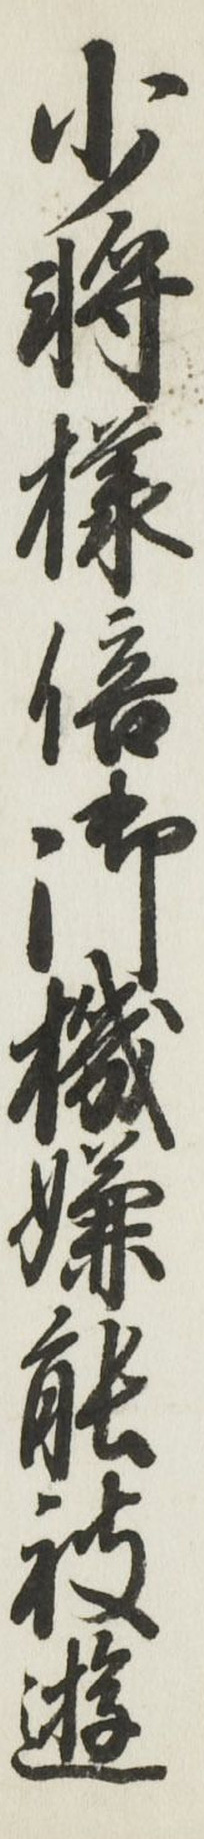少将様倍御機嫌能被遊
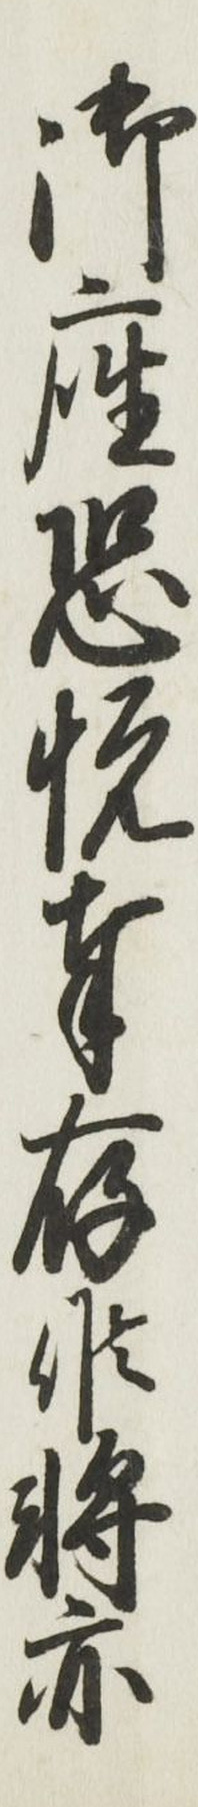御座恐悦奉存候将亦
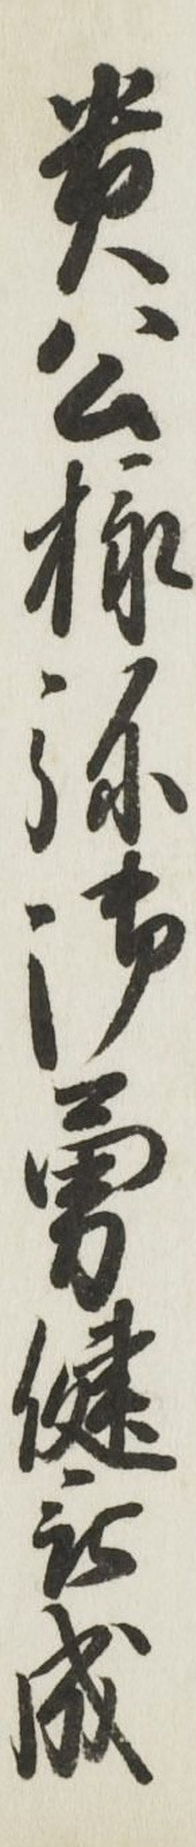貴公様弥御勇健被成
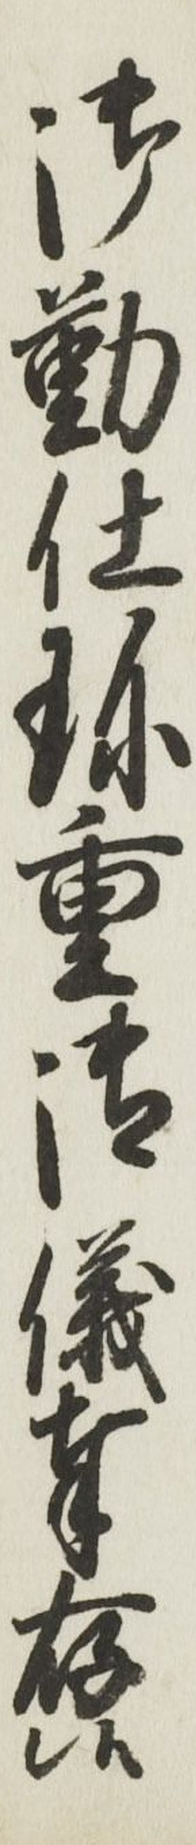御勤仕珍重御儀奉存候
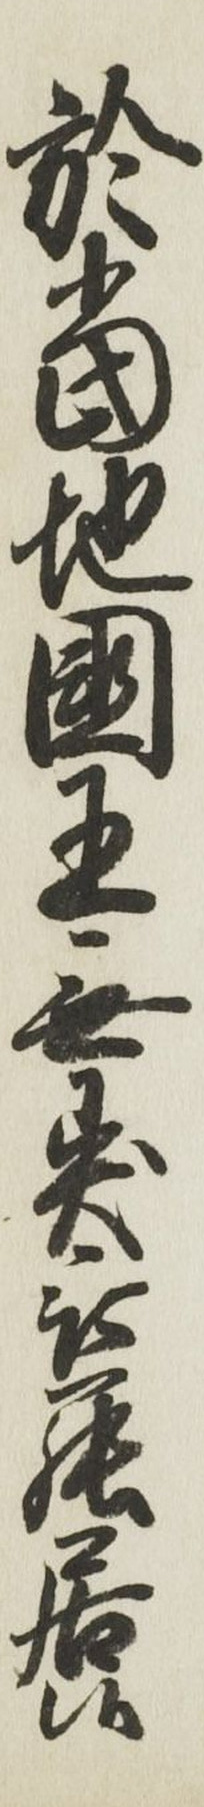於当地国王無異被罷居候
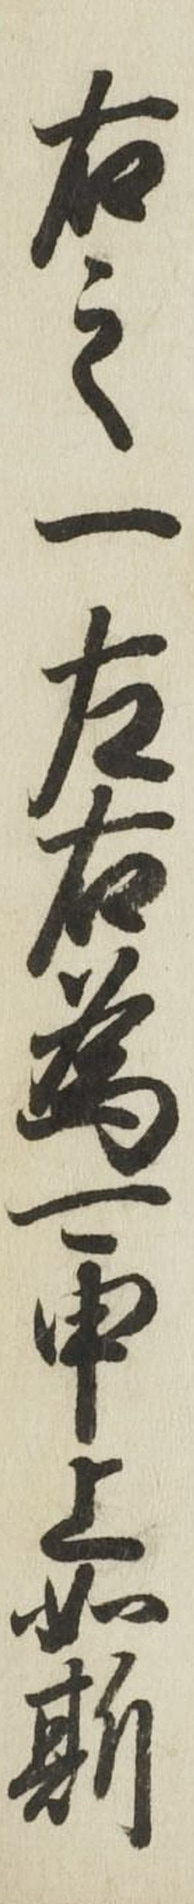右之一左右為可申上如斯
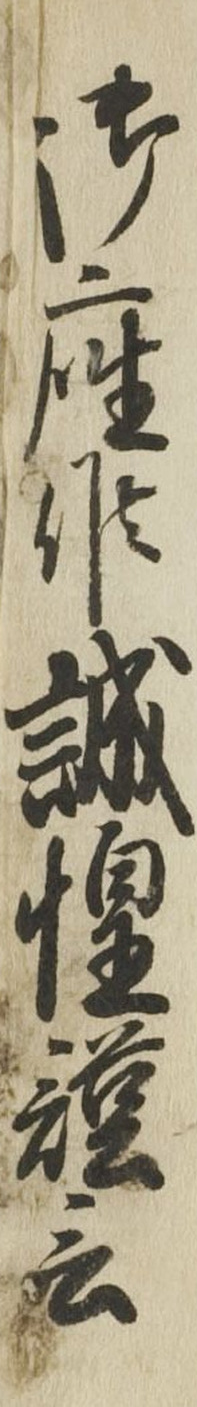御座候誠惶謹言
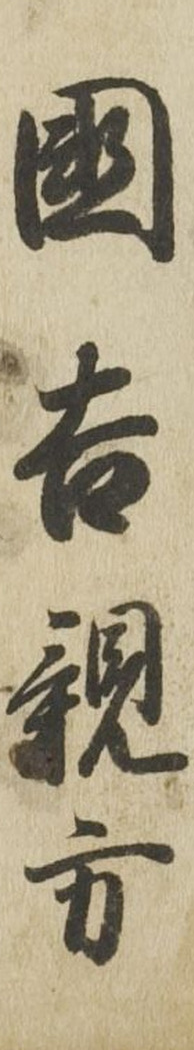国吉親方
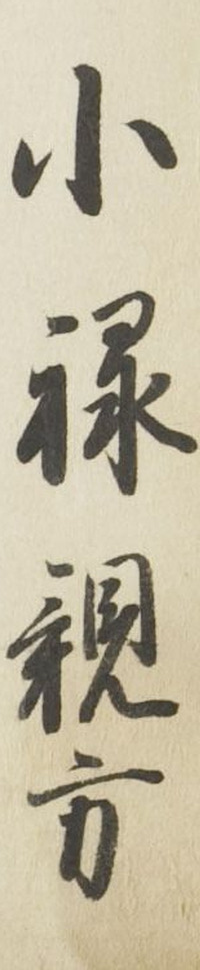小禄親方
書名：琉球王府花押印状 国吉親方・小禄親方 二月十五日
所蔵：University of the Ryukyus Library
